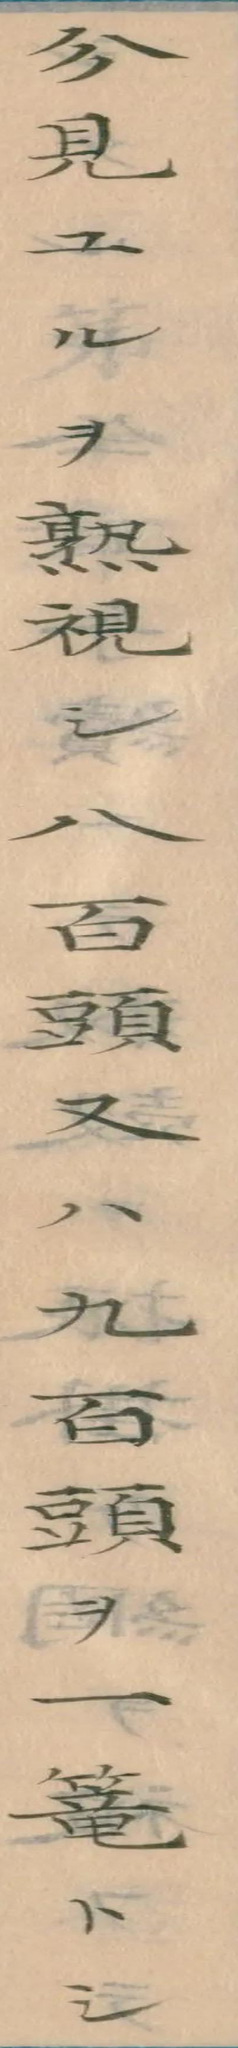分見ユルヲ熟視シ八百頭又ハ九百頭ヲ一篭トシ
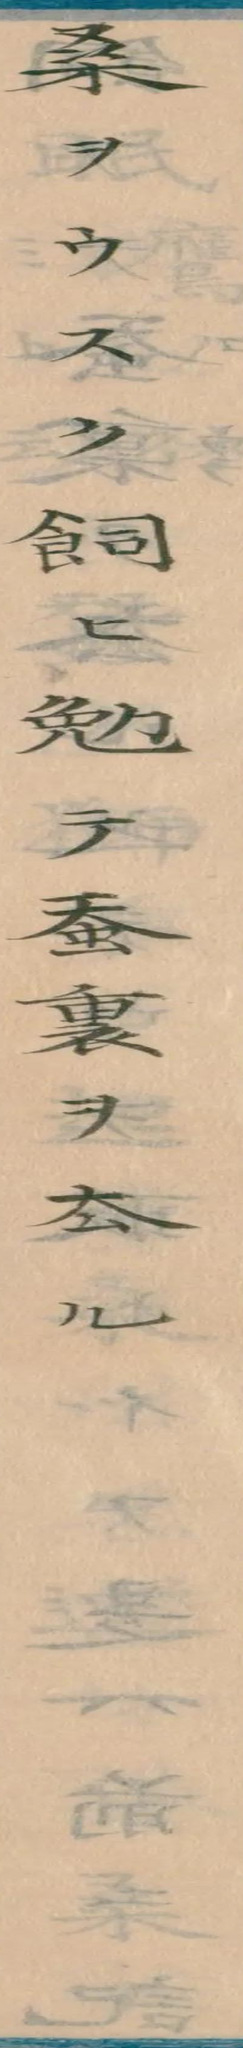桑ヲウスク飼ヒ勉テ蚕裏ヲ去ル
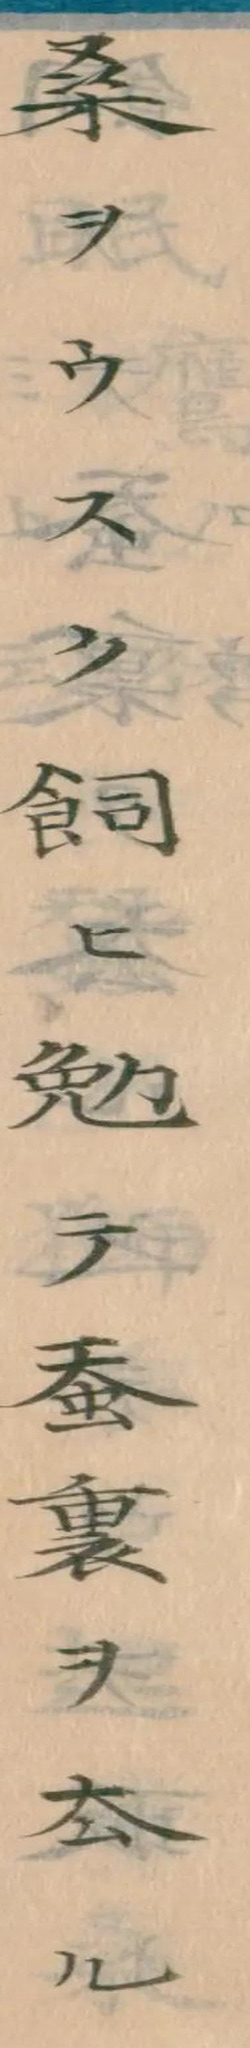桑ヲウスク飼ヒ勉テ蚕裏ヲ去ル
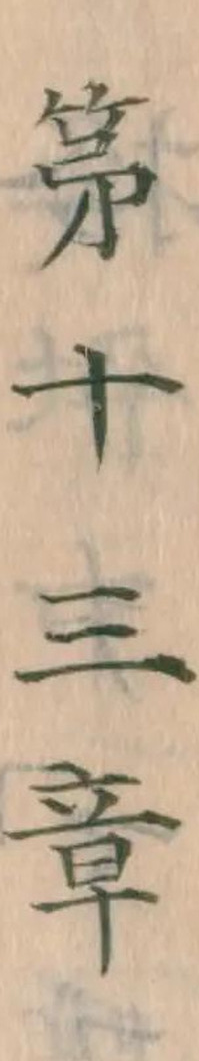第十三章
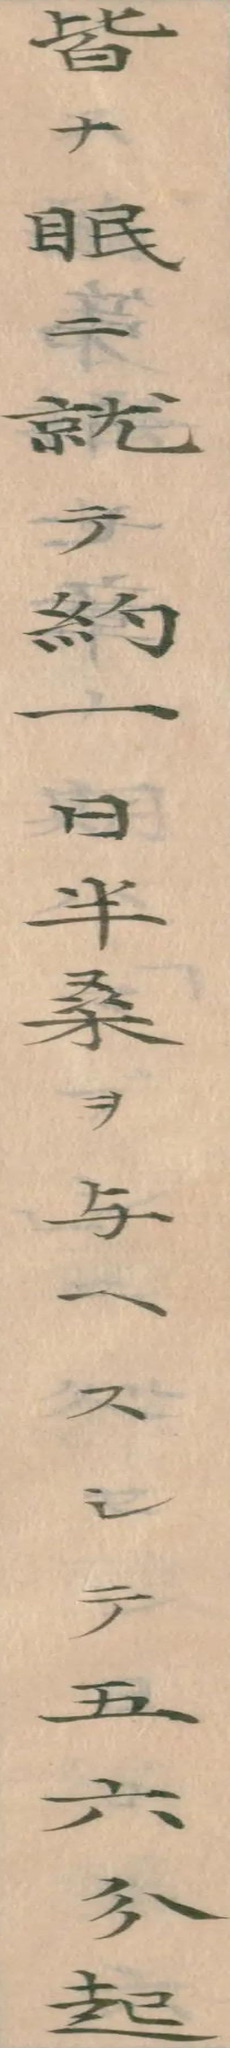皆ナ眠ニ就テ約一日半桑ヲ与ヘスシテ五六分起
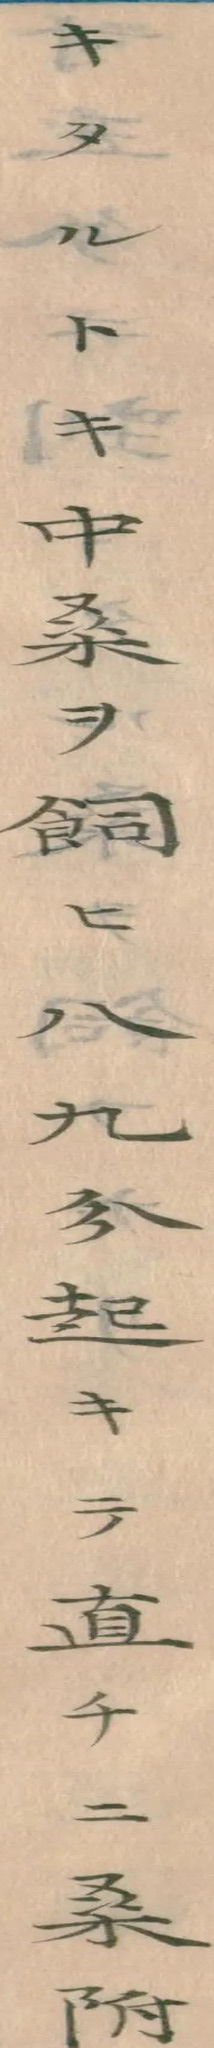キタルトキ中桑ヲ飼ヒ八九分起キテ直チニ桑附
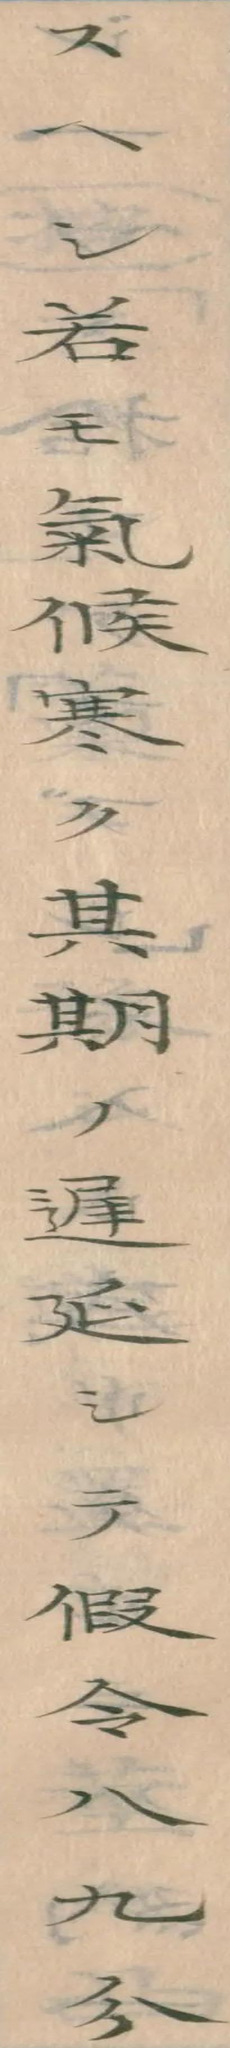スヘシ若モ気候寒ク其期ノ遅延シテ仮令八九分
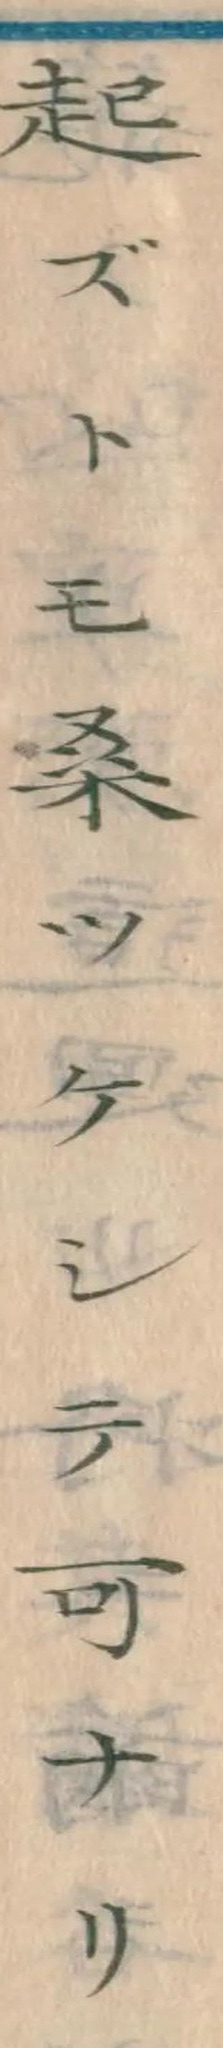起ズトモ桑ツケシテ可ナリ
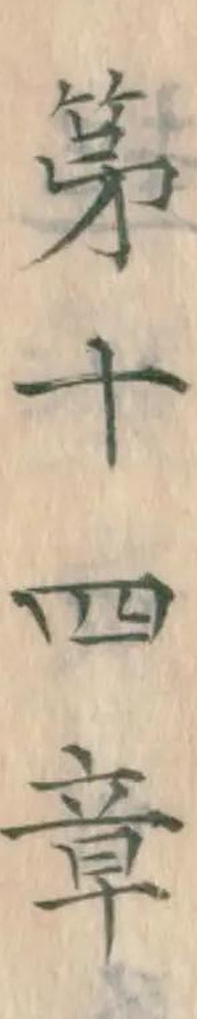第十四章
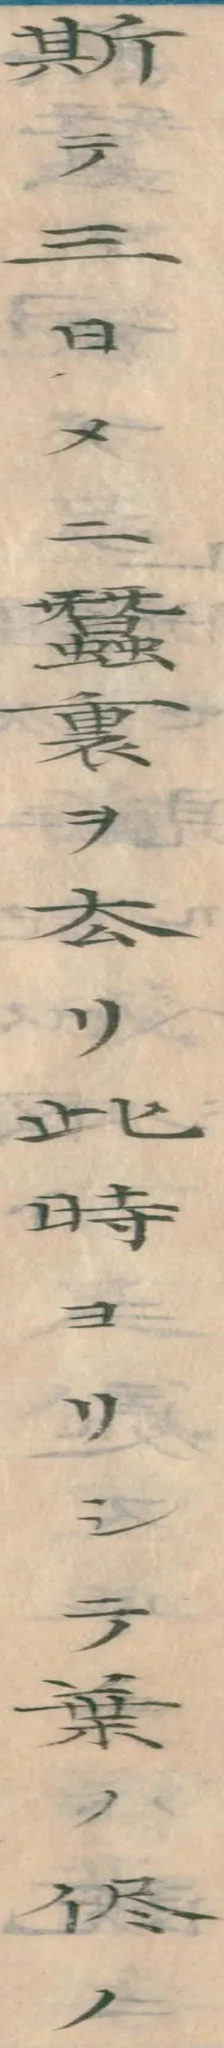斯テ三日メニ蚕裏ヲ去リ此時ヨリシテ葉ノ侭ノ
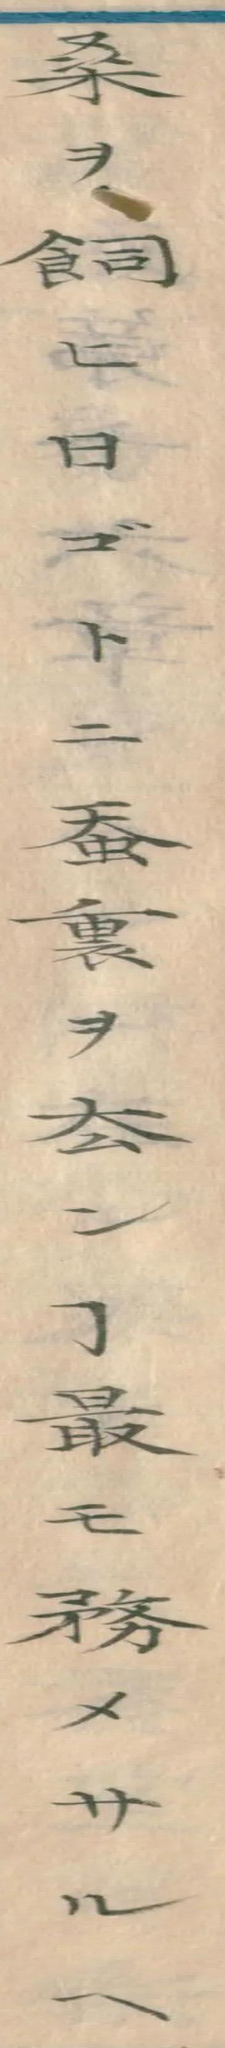桑ヲ飼ヒ日ゴトニ蚕裏ヲ去ンコト最モ務メサルヘ
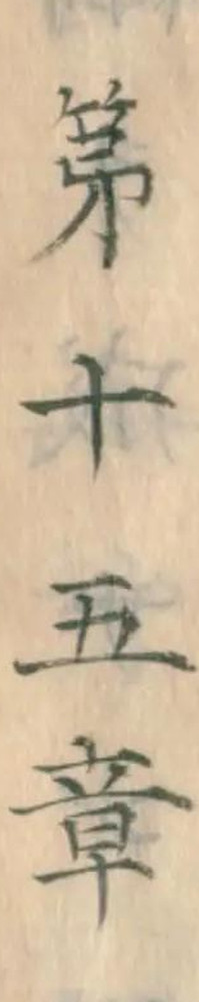第十五章

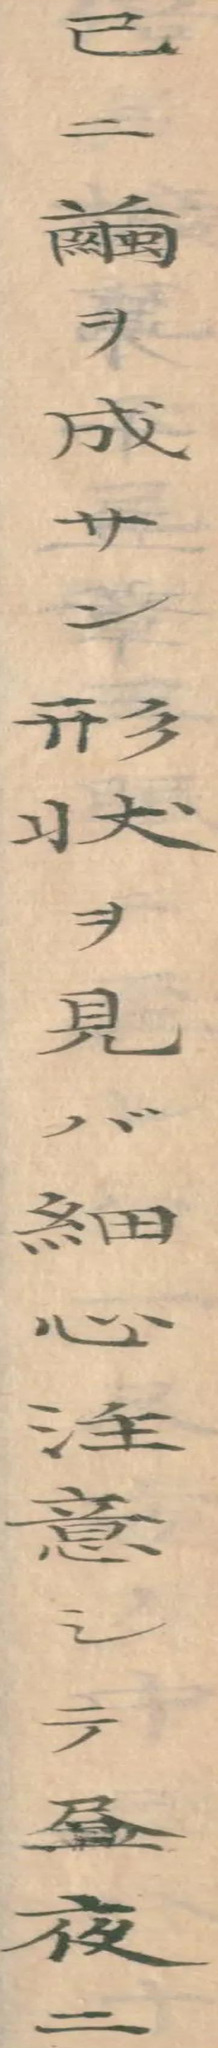已ニ繭ヲ成サン形状ヲ見バ細心注意シテ昼夜ニ
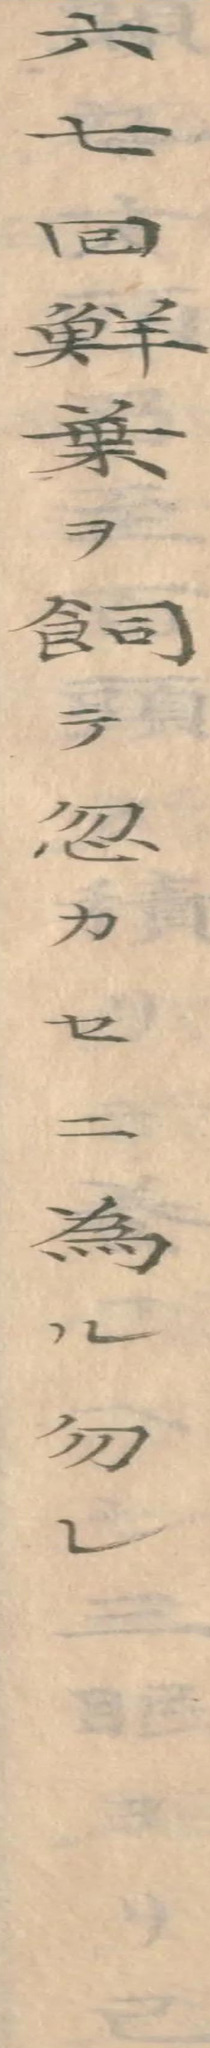六七回鮮葉ヲ飼テ忽カセニ為ル勿レ
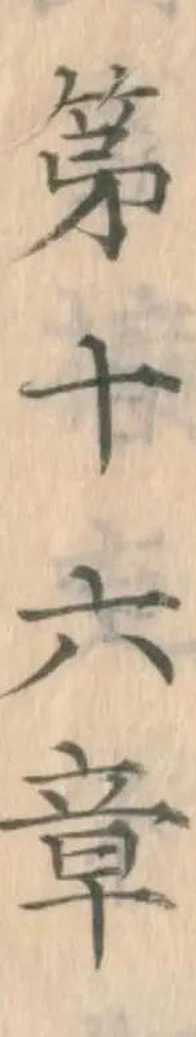第十六章
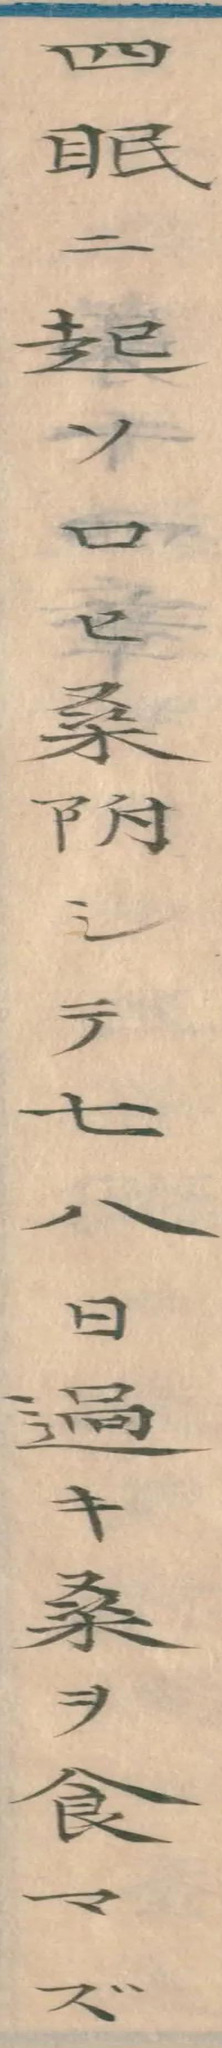四眠ニ起ソロヒ桑附シテ七八日過キ桑ヲ食マズ
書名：蚕桑集成
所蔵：国立国会図書館 National Diet Library, JAPAN
